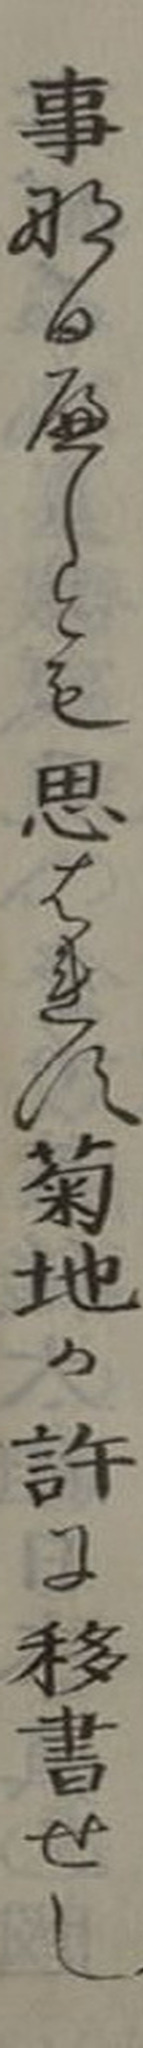事なるへしとも思はれす菊地の許に移書せし

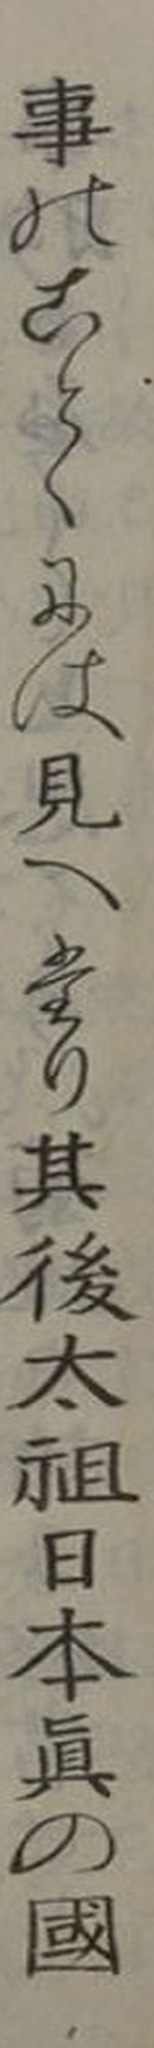事のことくには見へたり其後太祖日本眞の國
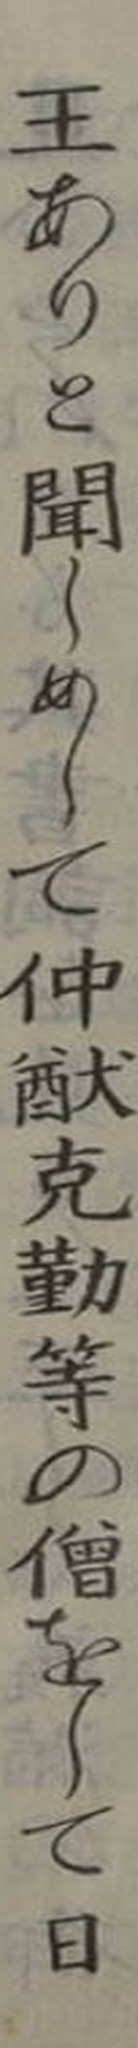王ありと聞しめして仲猷克勤等の僧をして日
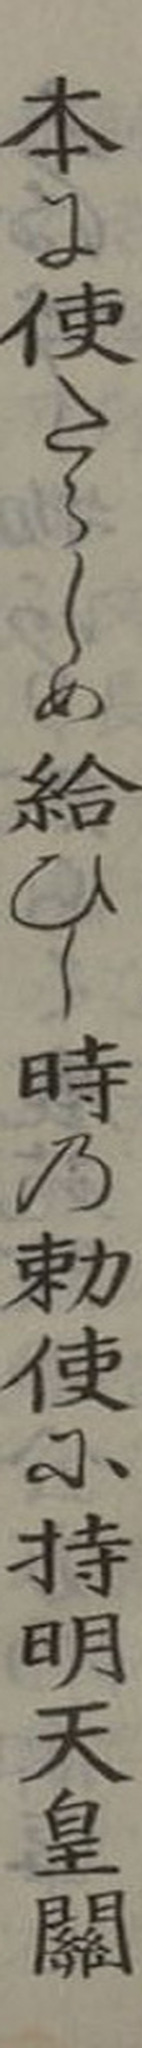本に使たらしめ給ひし時の勅使に持明天皇關
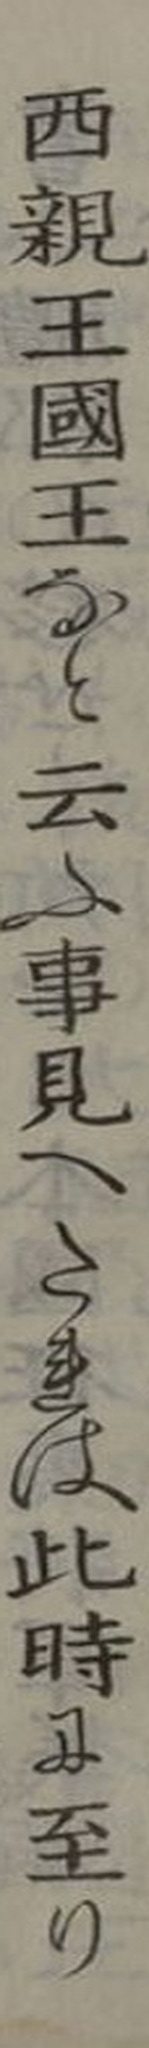西親王國王なと云ふ事見へたれは此時に至り
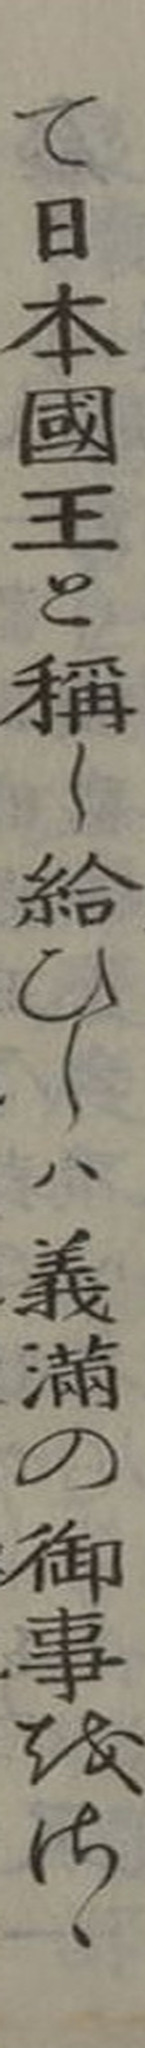て日本國王と稱し給ひしは義滿の御時をさゝ
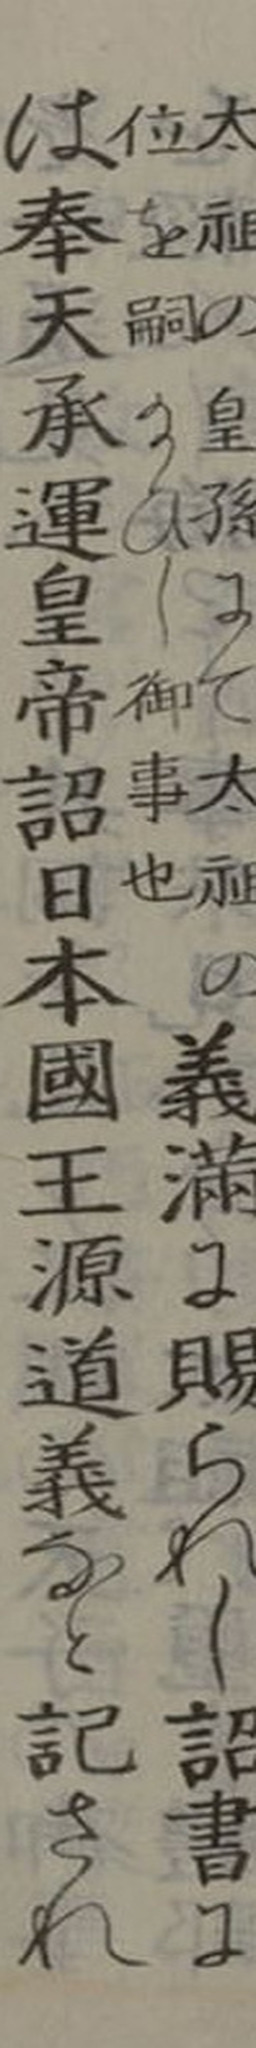は奉天承運皇帝詔日本國王源道義なと記され
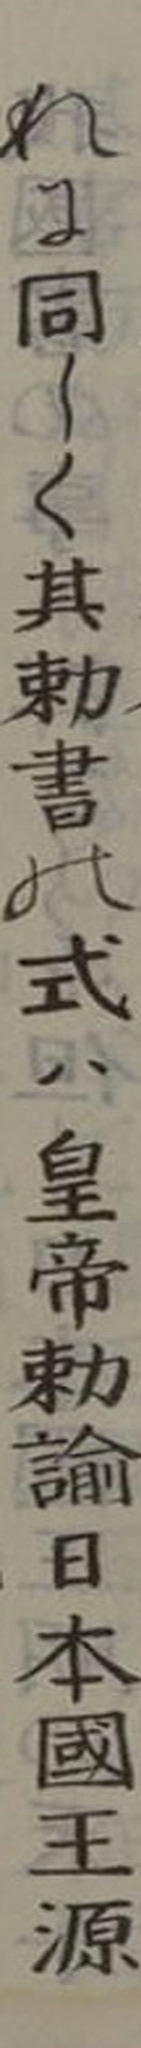れに同しく其勅書の式ハ皇帝勅論日本國王源
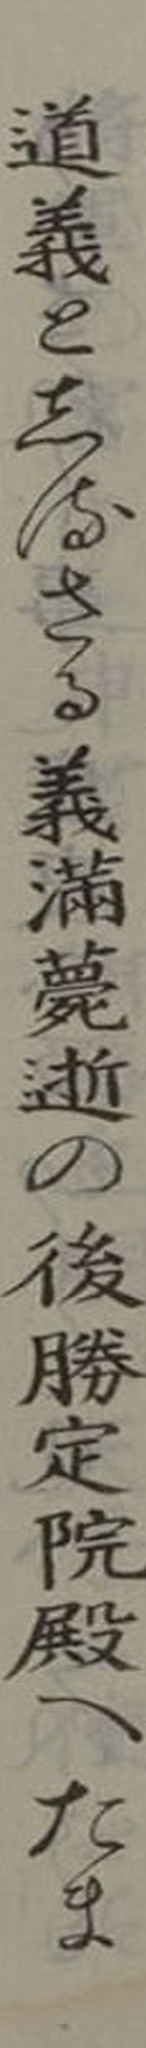道義としるさる義滿薨逝の後勝定院殿へたま
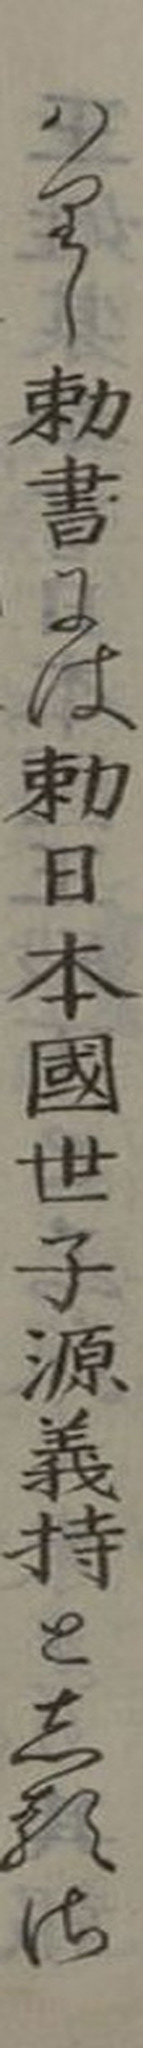ハりし勅書には勅日本國世子源義持としるさ
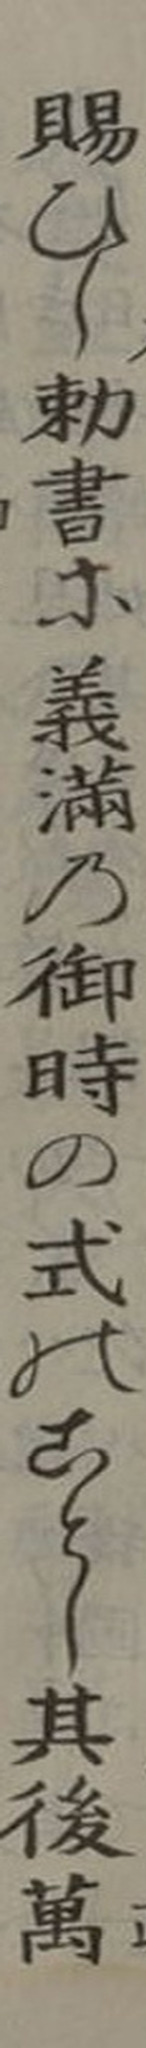賜ひし勅書に義滿の御時の式のことし其後萬
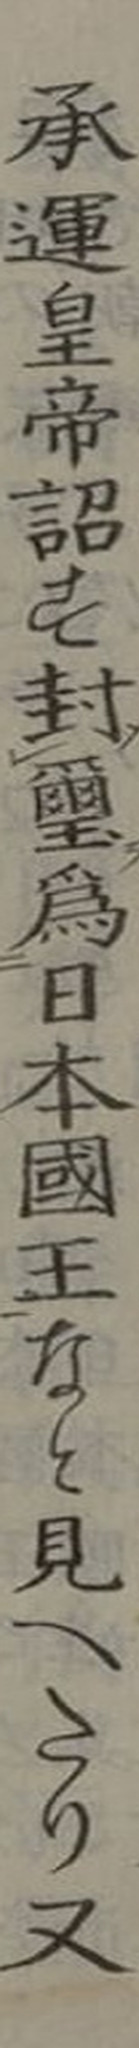承運皇帝詔す封璽爲日本國王なと見へたり又
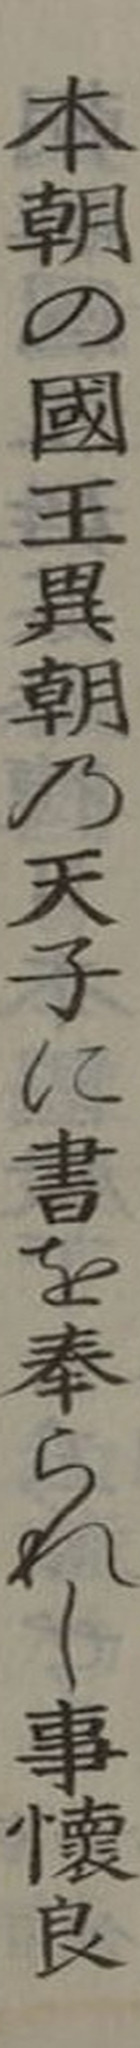本朝の國王異朝の天子に書を奉られし事懷良
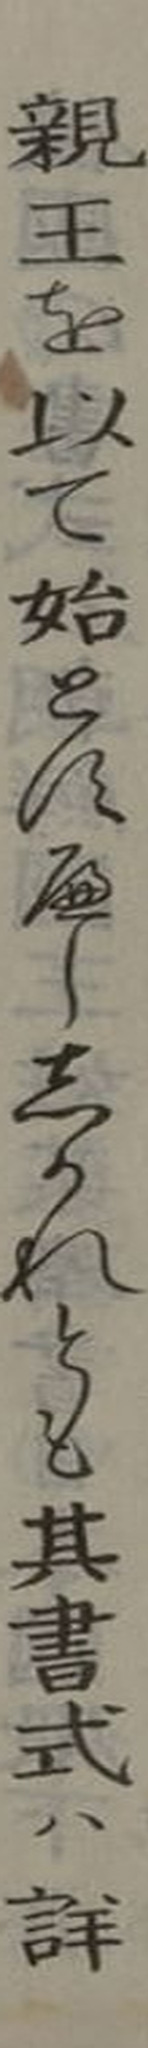親王を以て始とすへししかれとも其書式ハ詳
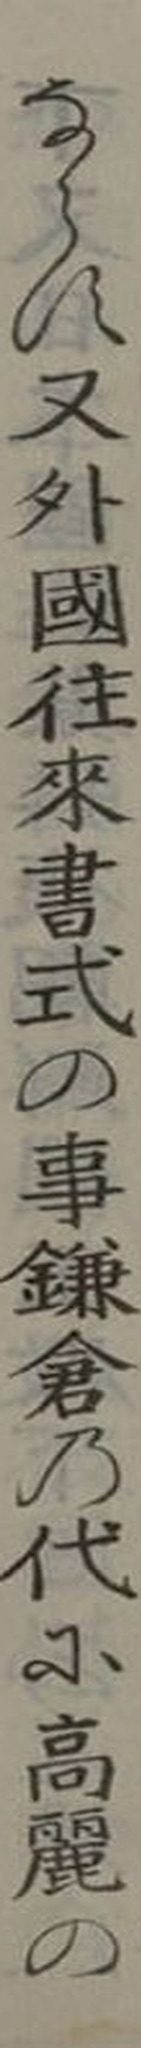ならす又外國往來書式の事鎌倉の代に高麗の
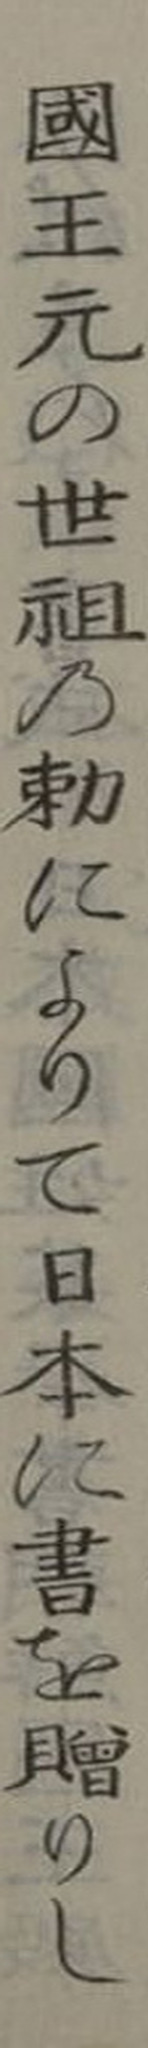國王元の世祖の勅によりて日本に書を贈りし
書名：骨董録
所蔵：University of the Ryukyus Library
